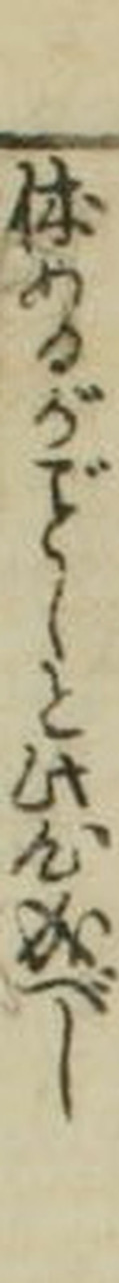休めるがごとしと此心成べし
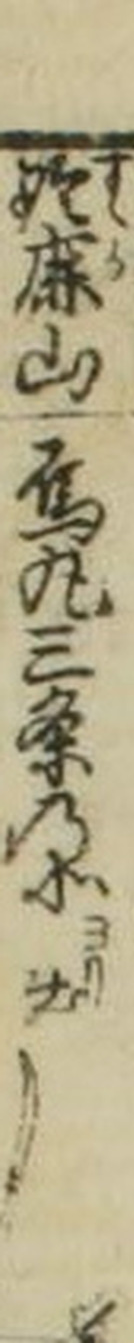鈴鹿山烏丸三条の北出
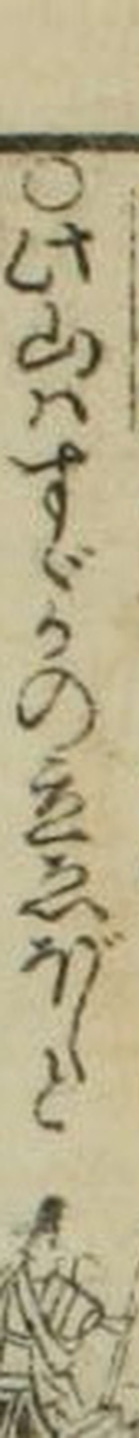◯此山はすゞかの立ゑぼしと
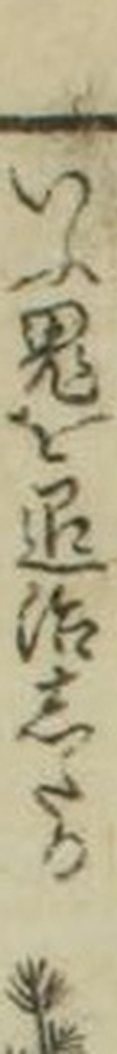いふ鬼を退治したる
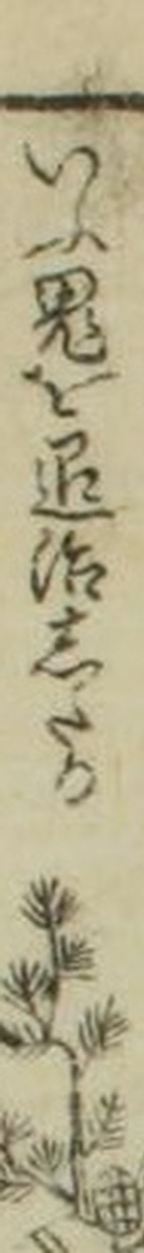いふ鬼を退治したる
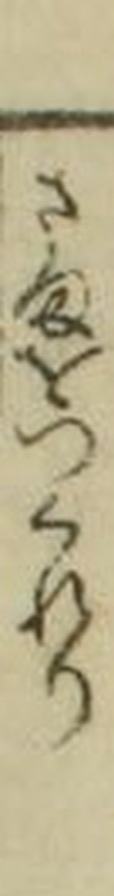さまをつくれり
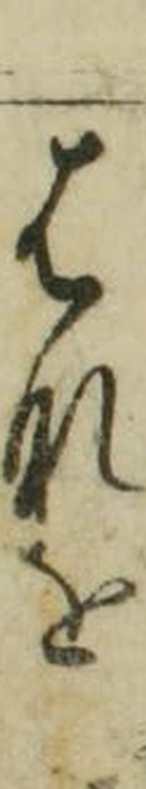はなを
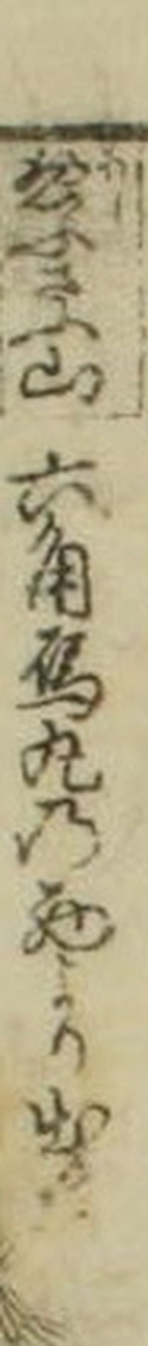悪ふさふ山六角烏丸の西より出る
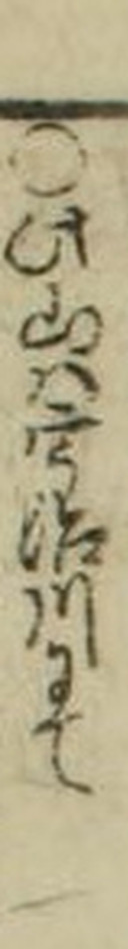◯此山は宇治川にて
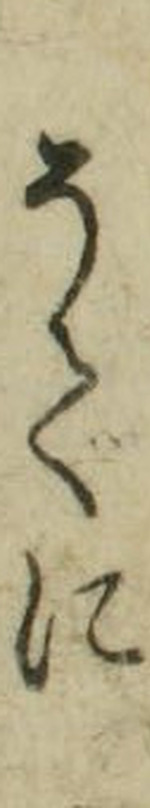そでに
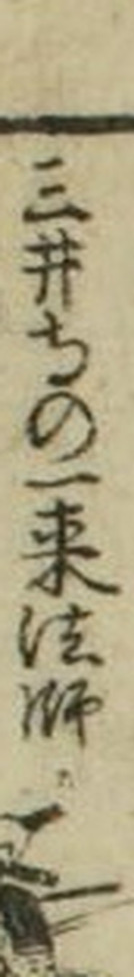三井寺の一来法師
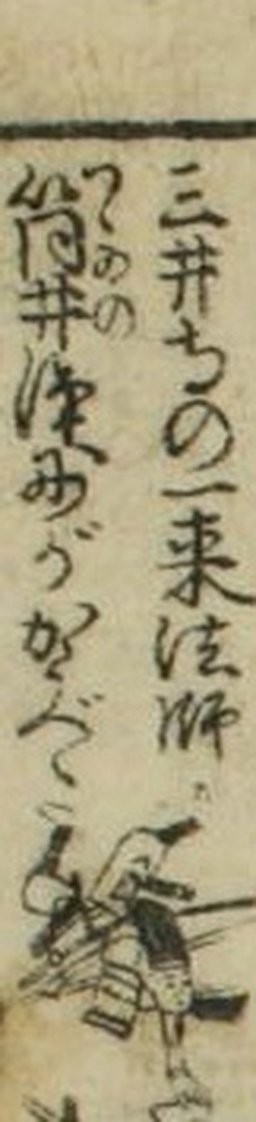筒井淨妙がかうべゝ
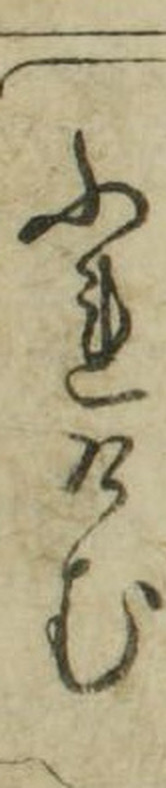ふれけむ
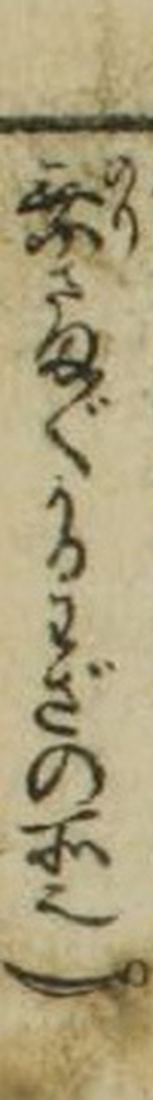乗またぐかるわざの所也

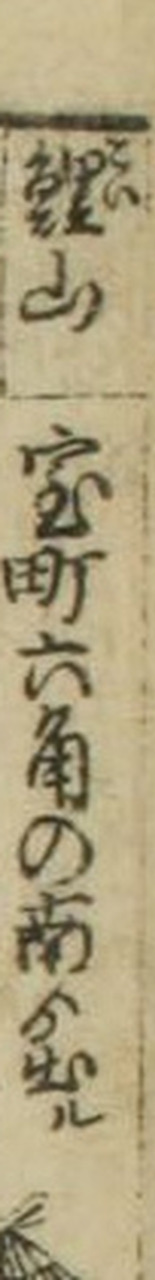鯉山室町六角の南より出ル
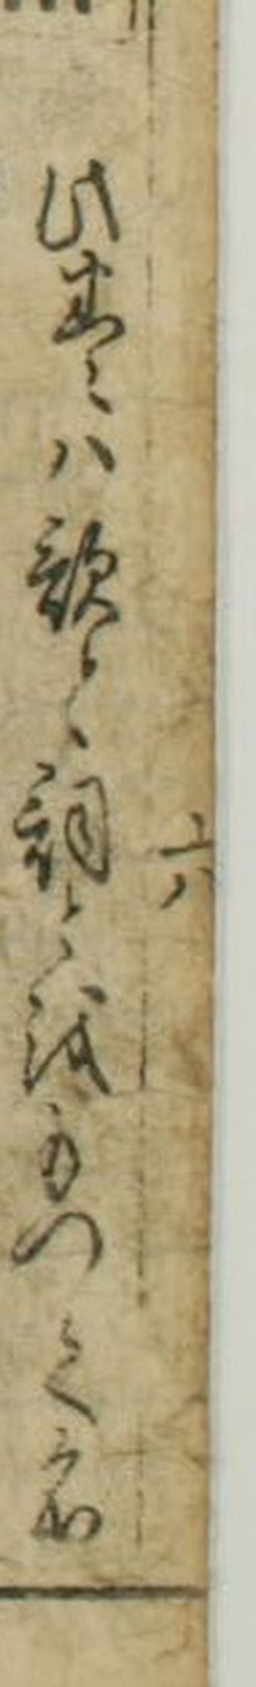此巻ハ歌と詞とをもつて名
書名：女源氏教訓鑑
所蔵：東京学芸大学附属図書館
